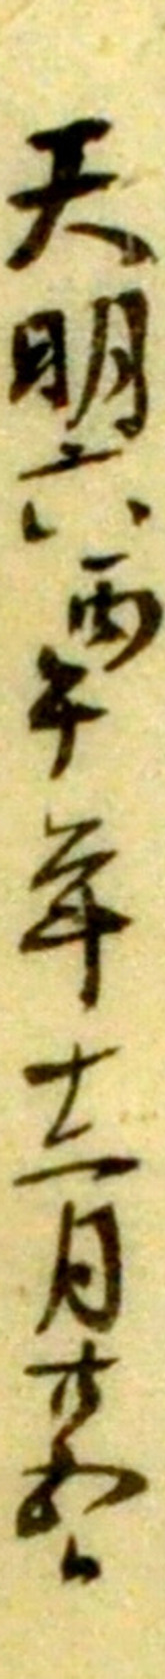天明六丙午年十二月廿五日
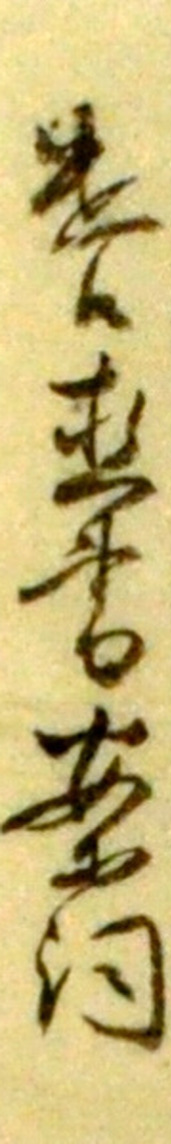遣候直書案詞
